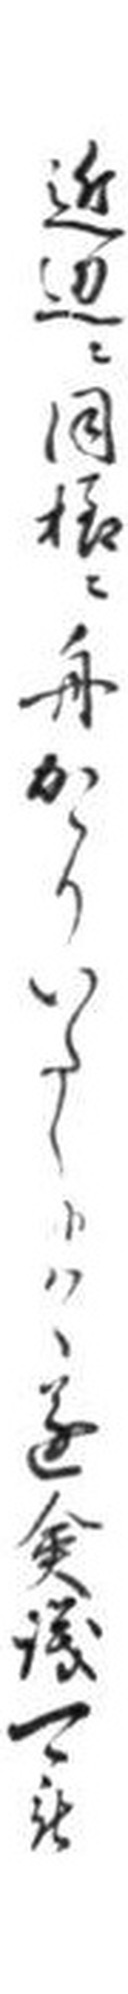浜辺ニ同様ニ舟かゝりいたし候ハヽ遂僉議可被
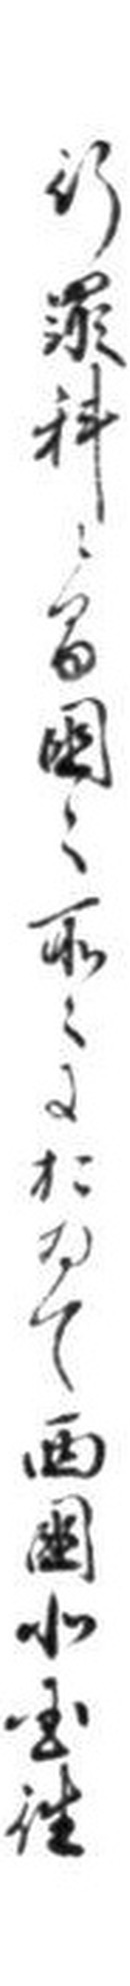行罪科候間国々所々におゐて西国小国往
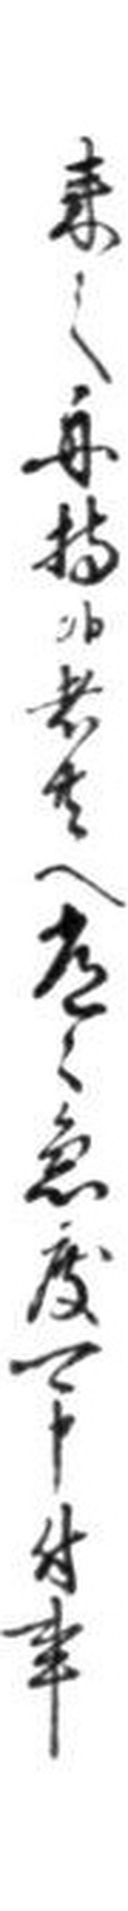来之舟持候者共へ常々急度可申付事
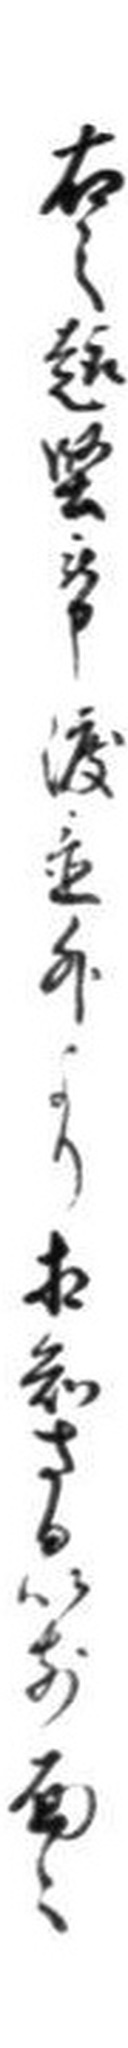右之趣堅被申渡置外より相知さる以前面々
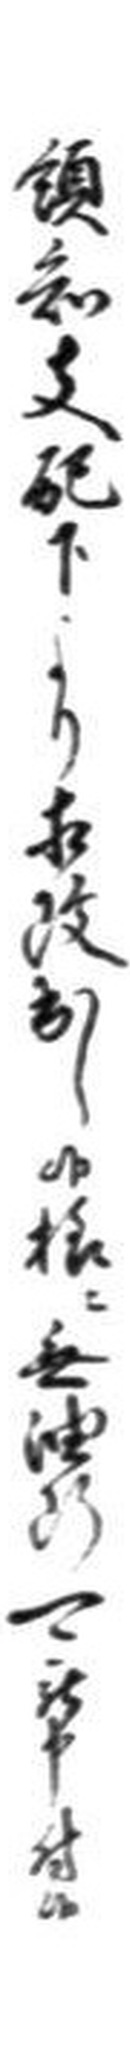領知支配下より相改出し候様ニ無油断可被申付候
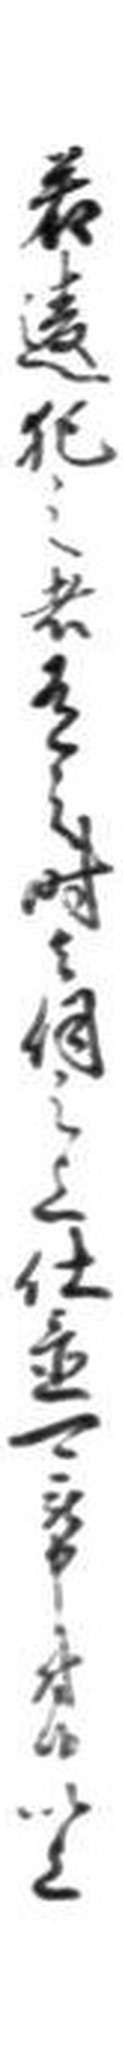若違犯之者有之時者伺之上仕置可被申付候以上
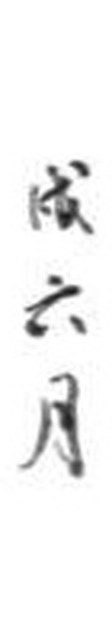戌六月
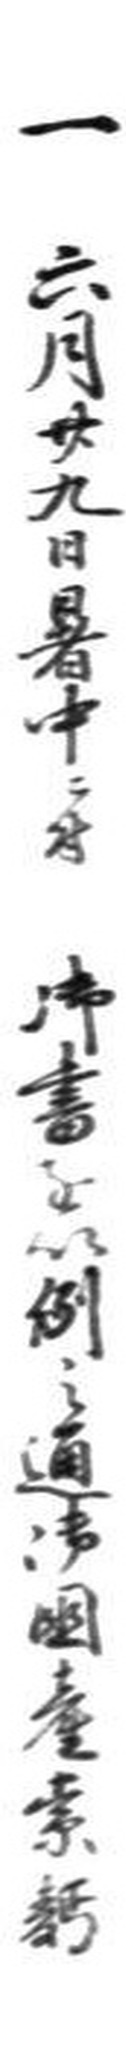一六月廿九日暑中ニ付御書を以例之通御国産素麪
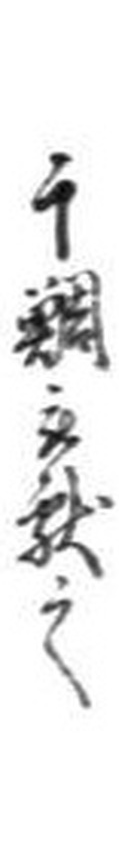干鯛被献之
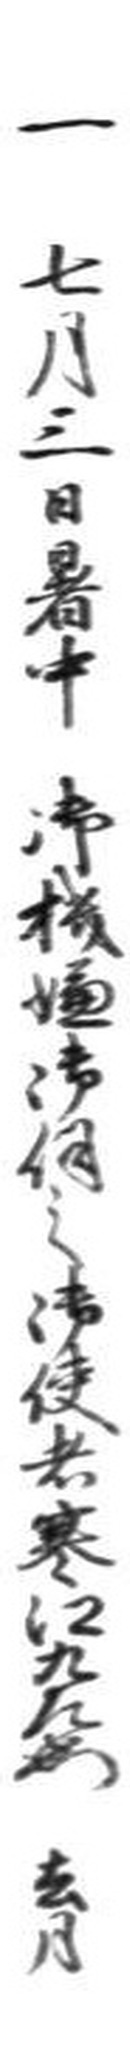一七月三日暑中御機嫌御伺之御使者寒江九左衛門去月

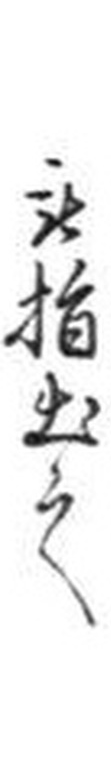被指出之
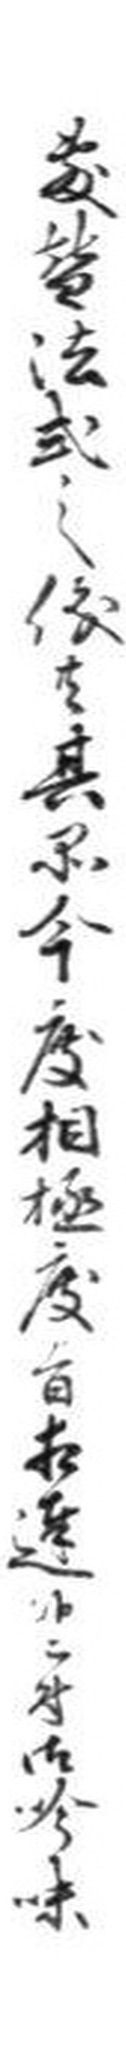敷替法式之儀共其品今度相極度旨相達候ニ付御吟味
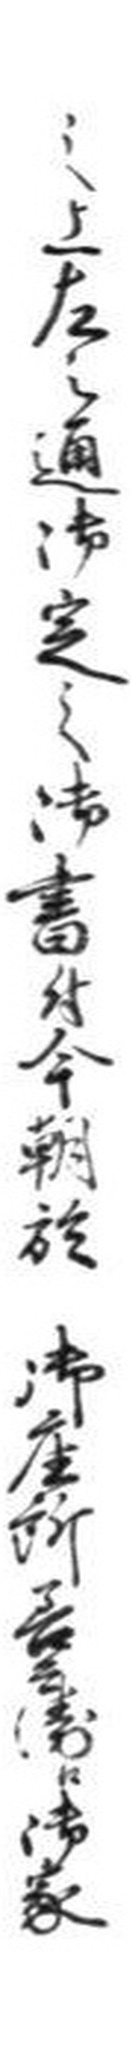之上左之通御定之御書付今朝於御座所善兵衛江御家
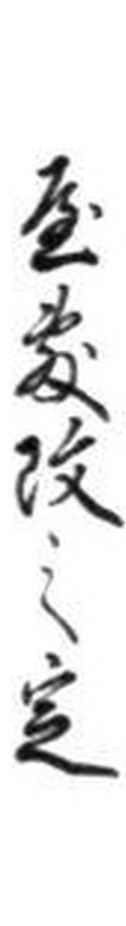屋敷改之定
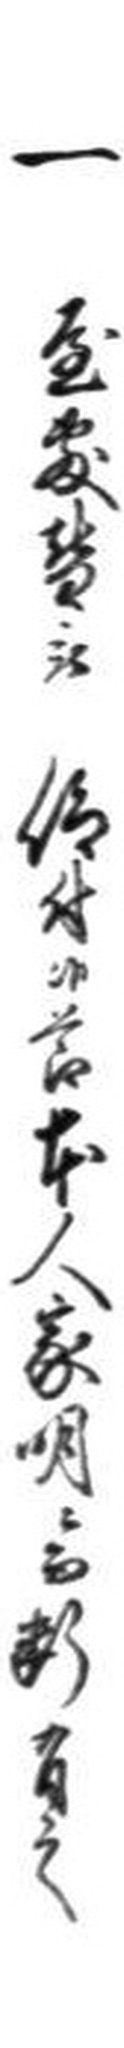一屋敷替被仰付候節本人家明ニ而断有之
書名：家譜 三十二 吉邦公 従享保二年到享保三年
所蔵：福井県文書館 Fukui Prefectural Archives
